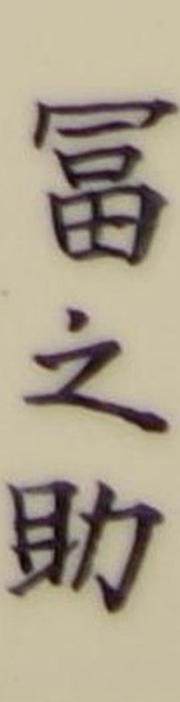冨之助
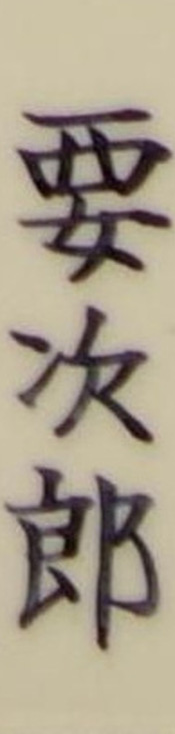要次郎
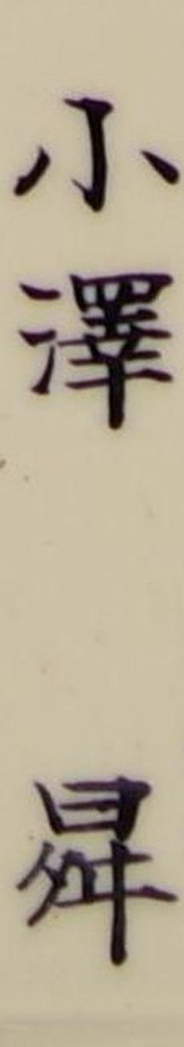小澤屏
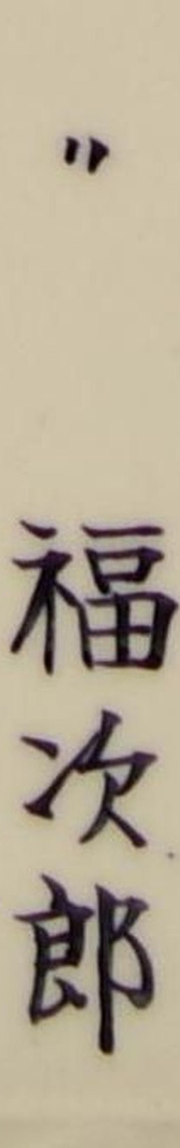福次郎
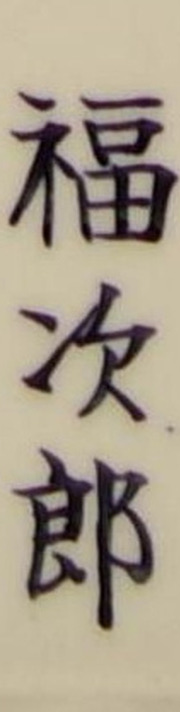福次郎

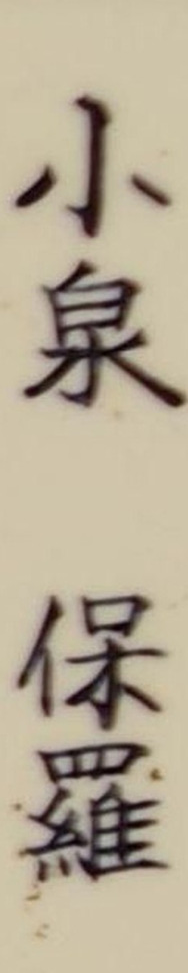小泉保羅
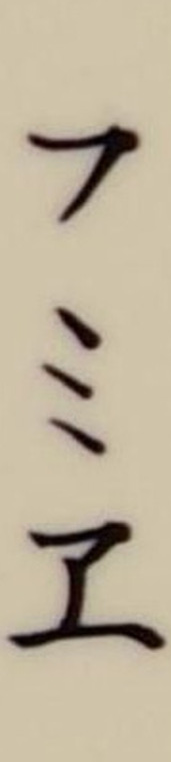フミエ
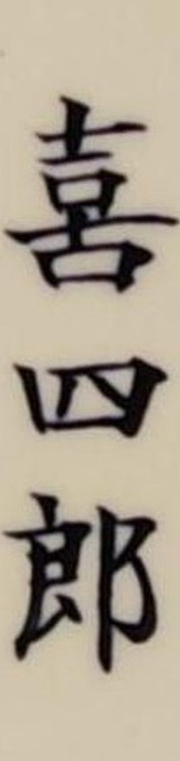喜四郎
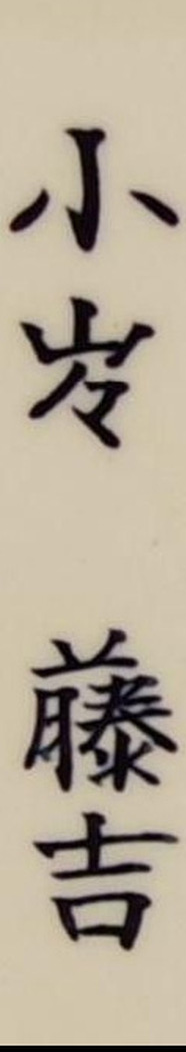小山藤吉
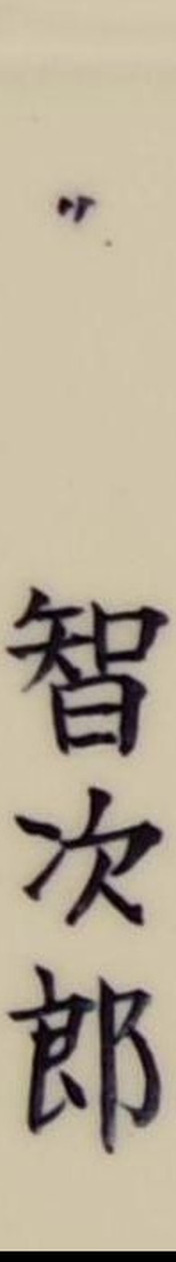智次郎
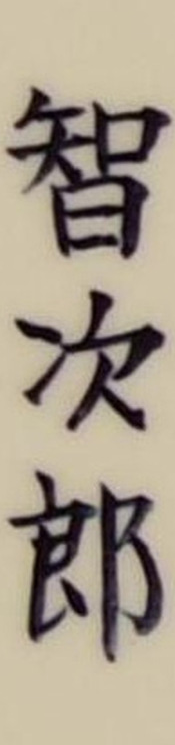智次郎
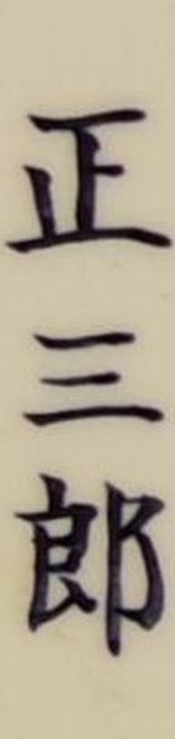正三郎
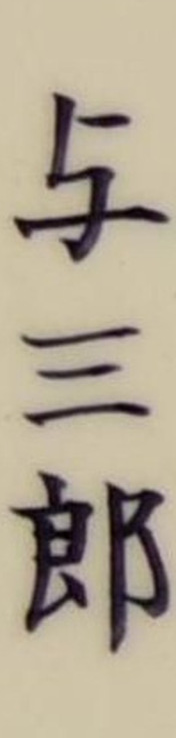与三郎
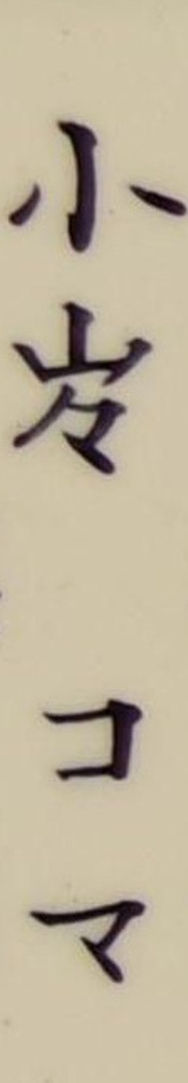小山コマ
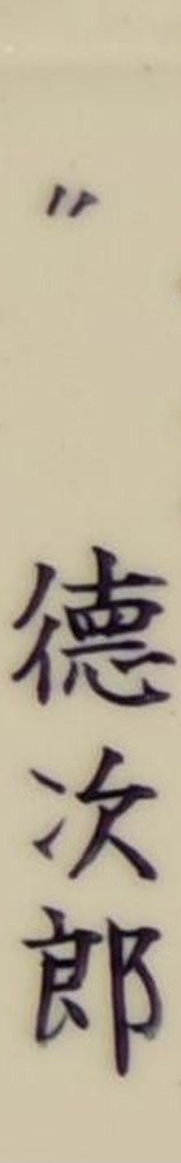徳次郎
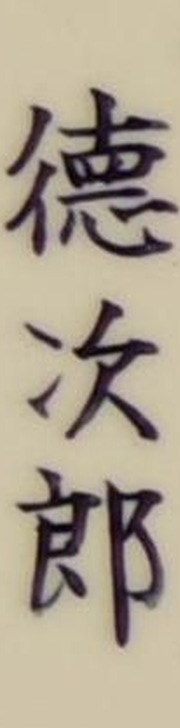徳次郎
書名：E~L
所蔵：高野山金剛峯寺
